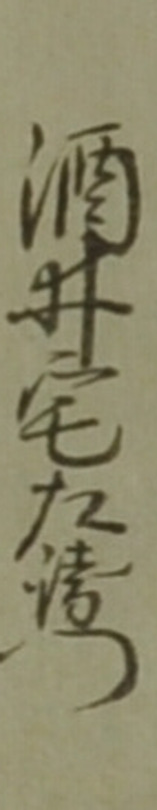酒井宅左衛門
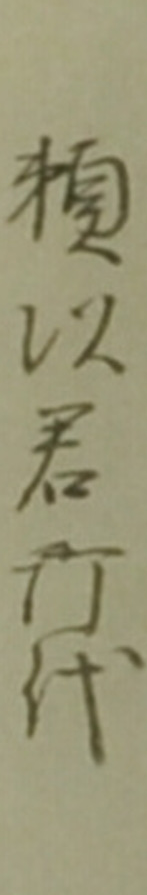頼以君御代
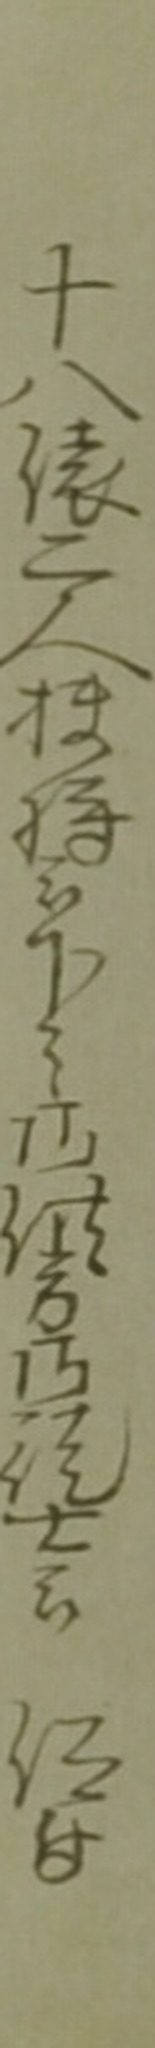十八俵二人扶持被下之御供方御徒士被仰付

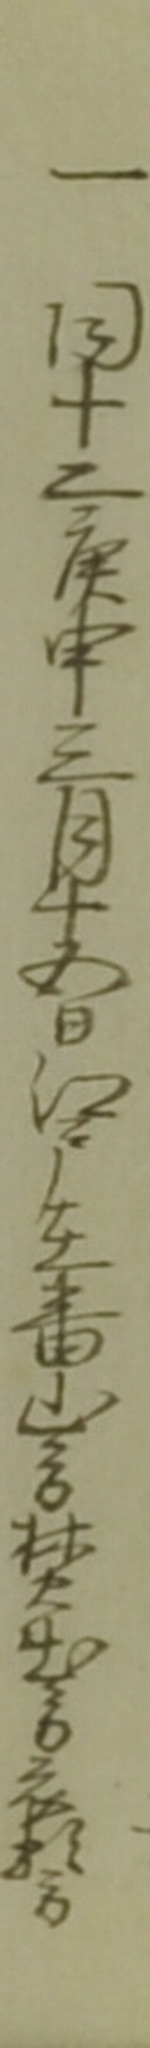一同十二庚申三月十五日江戸在番山方焚出方衣類方
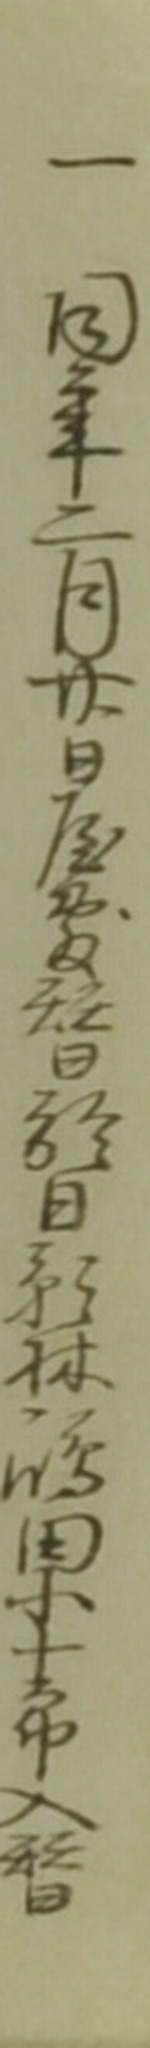一同年二月廿日屋敷替於日預林嶋田小十郎入替
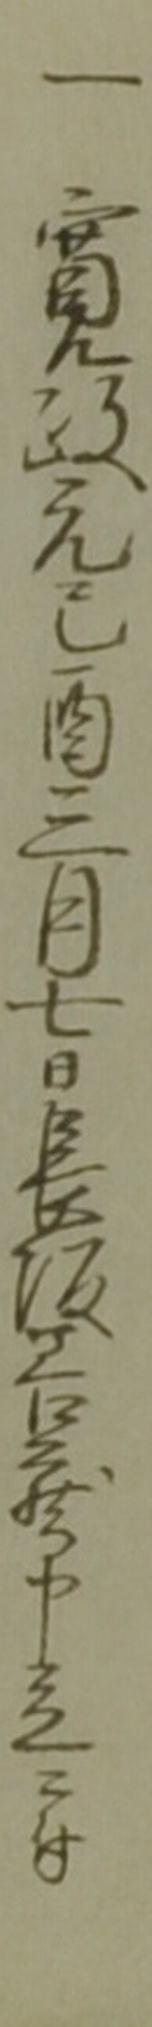一寛政元己酉三月七日長坂善蔵申立ニ付
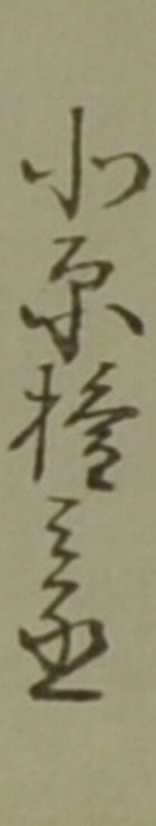北原権之丞
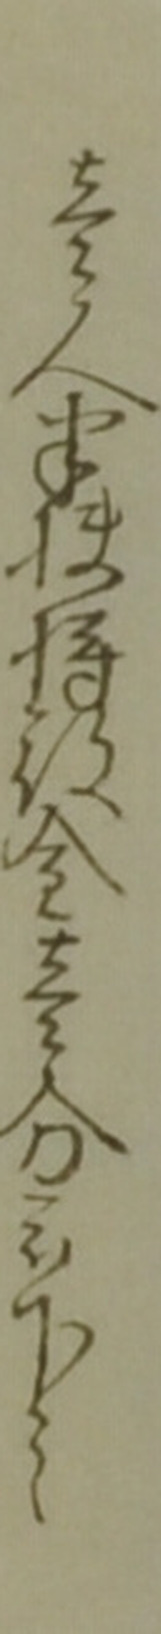壱人半扶持役金壱分被下之
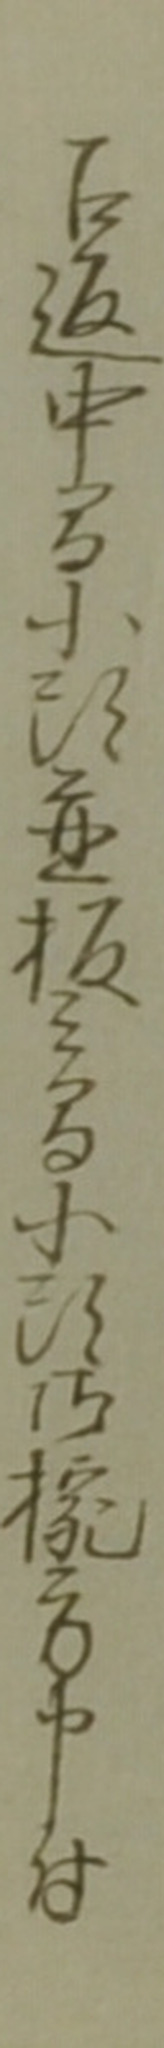召返中間小頭並板之間小頭御椀方申付
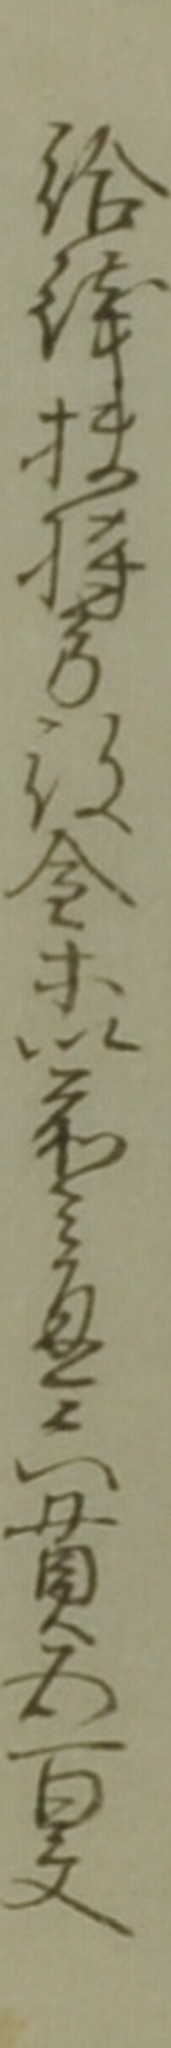給銭扶持方役金等以前之通六貫五百文
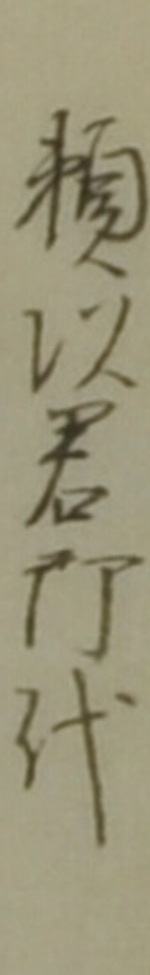頼以君御代
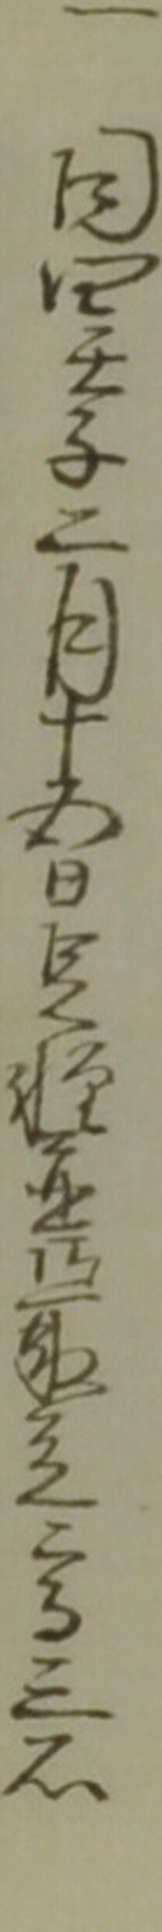一同四壬子二月十五日足軽並御取立高三石
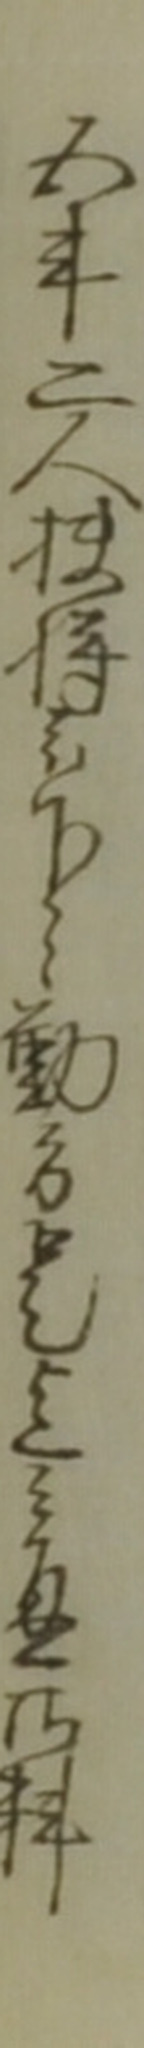五斗二人扶持被下之勤方是迄之通御料
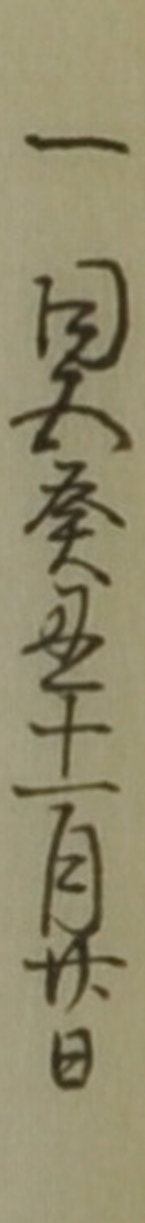一同五癸丑十一月廿日
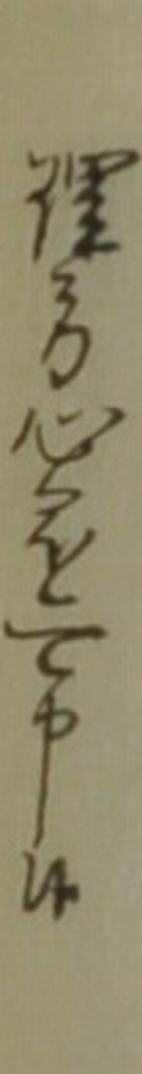理方心懸可申候
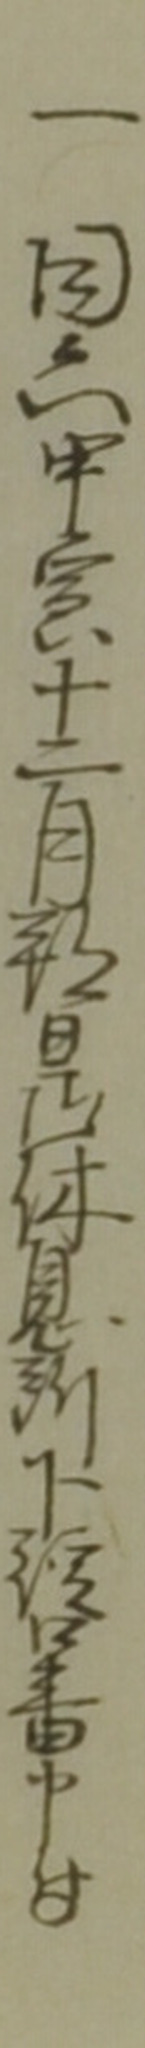一同六甲寅十二月朔日御休息所下錠口番申付
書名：無足廃家（弐）
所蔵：伊那市立高遠町図書館・合同会社AMANE
